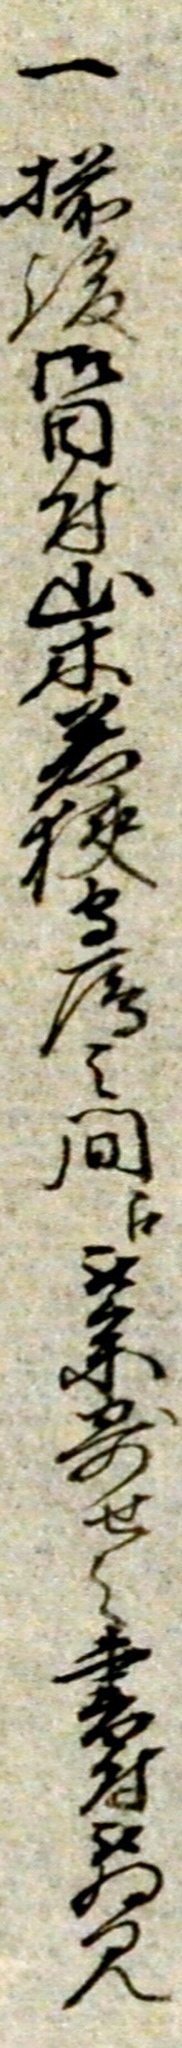一揃後御目付山木若狭守雁の間江被参寄せ之書付被為見
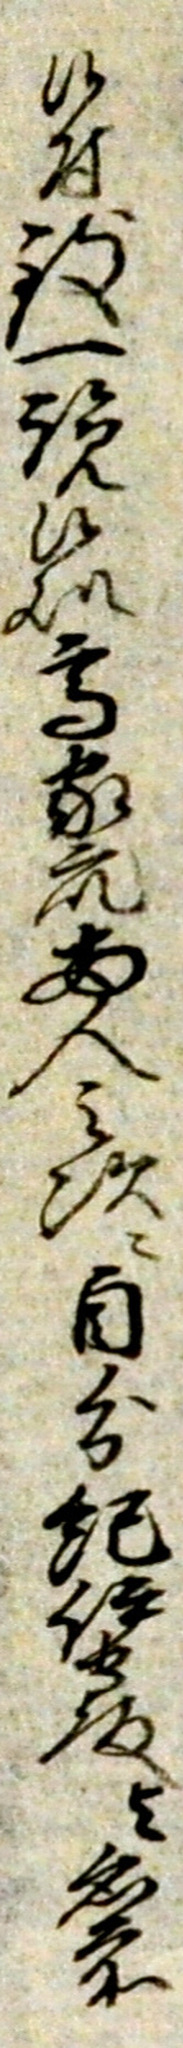候付致一読候処高家衆両人之次ニ自分紀伊守殿与名前
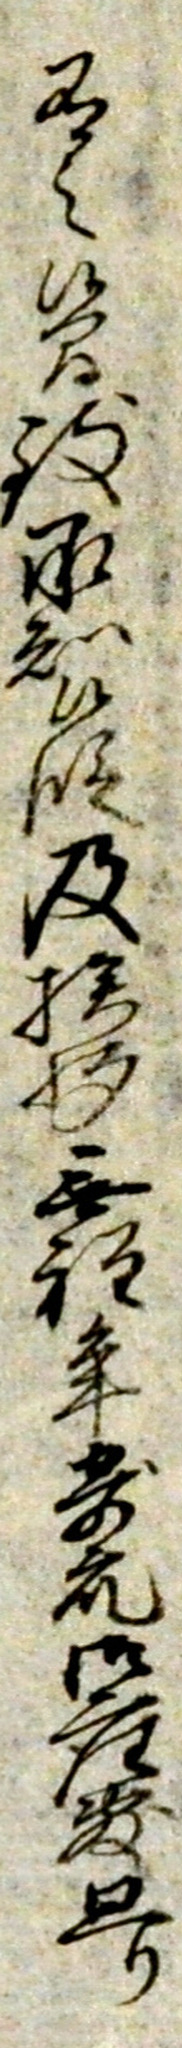有之候間致承知候段及挨拶無程年寄衆御座敷廻り
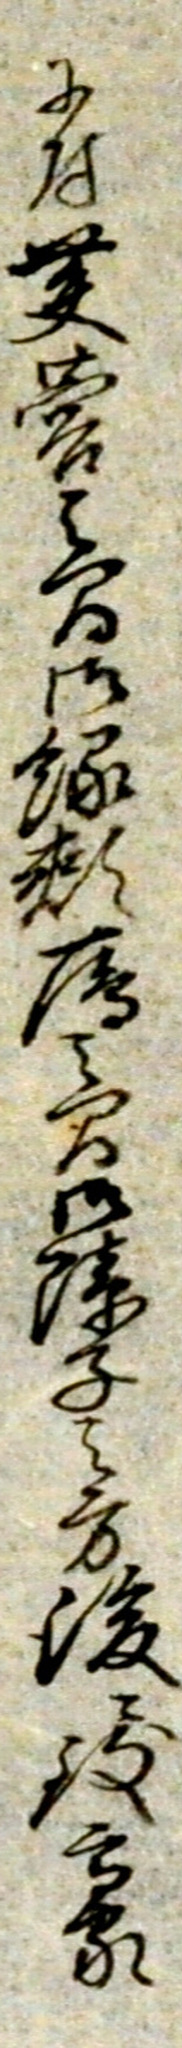尓付芙蓉之御縁頬雁之御障子之方後二致高家
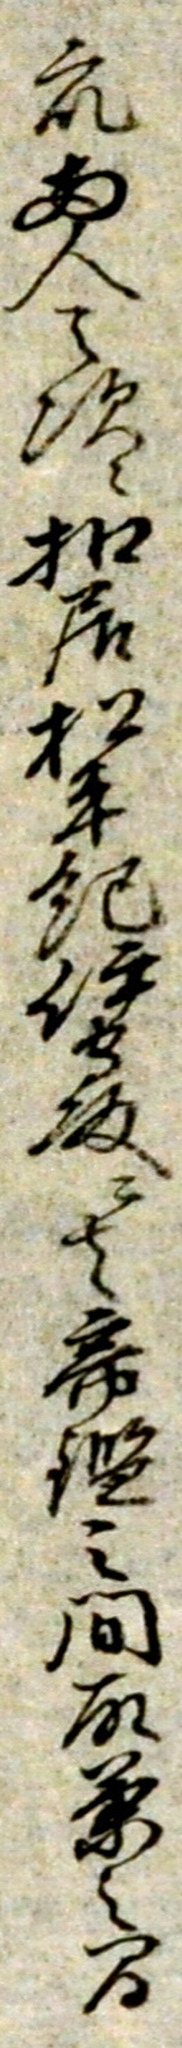衆両人之次ニ控居松平紀伊守殿ニ者帝鑑之間故兼之間
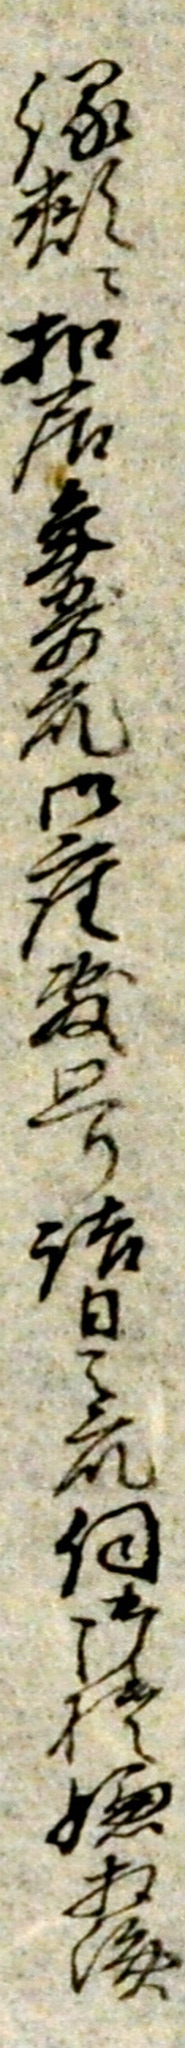縁頬二扣居年寄衆御座敷廻り詰日之衆伺御機相済
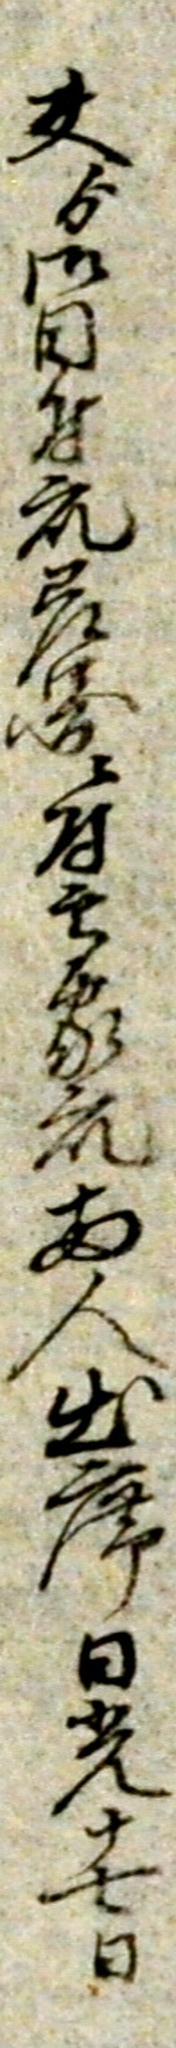夫ゟ御目付衆差図ニ付高家衆両人出席日光十七日
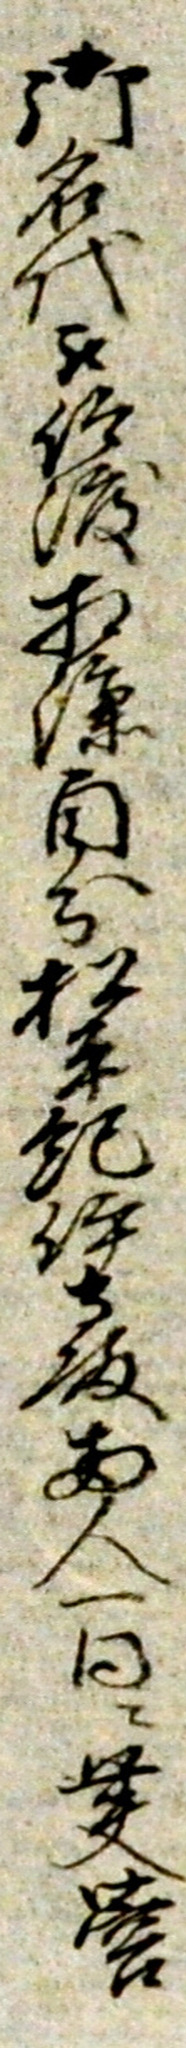御名代被仰渡相済自分松平紀伊守殿両人一同ニ芙蓉
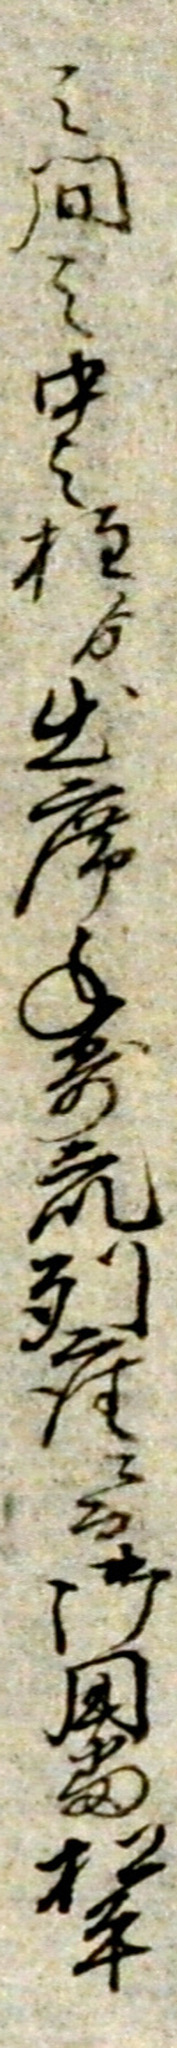之間之中之柱ゟ出席年寄衆列座二而御用番松平
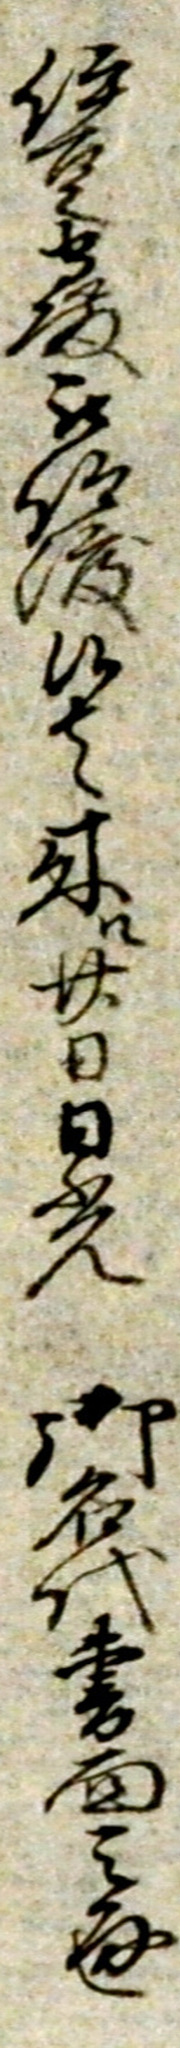伊豆守殿被仰渡候者來ㇽ廿日日光御名代書面之通
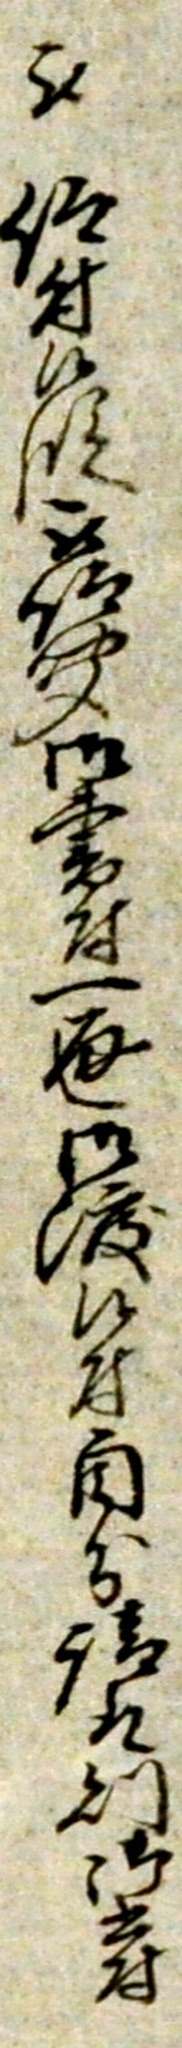被仰付候段被仰聞御書付一通御渡候付自分受取則御書付
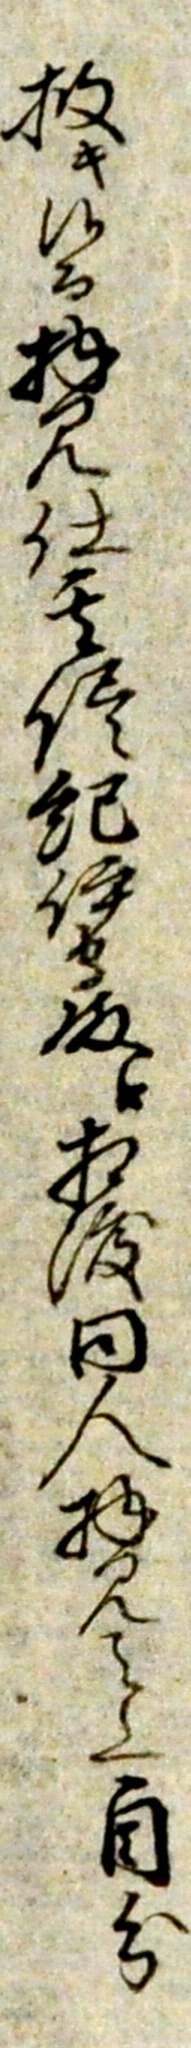披キ候而拝見仕其儘紀殿江相渡同人拝見之上自分
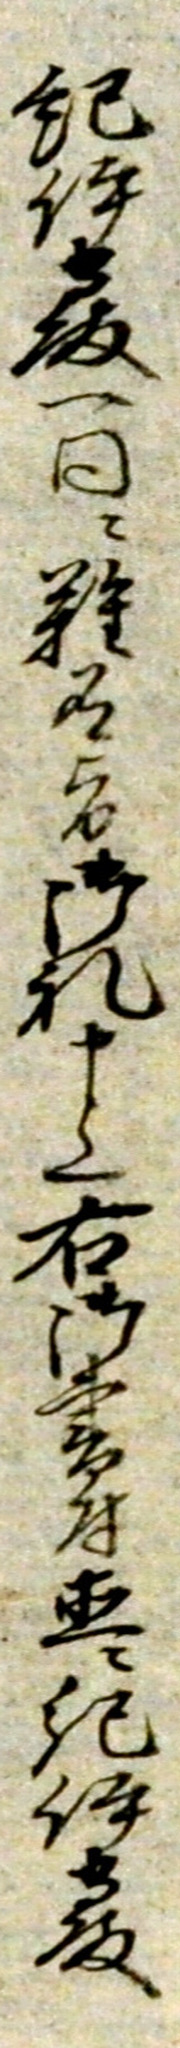紀伊守殿一同ニ難有旨御礼申上右御書付直ニ紀伊守殿
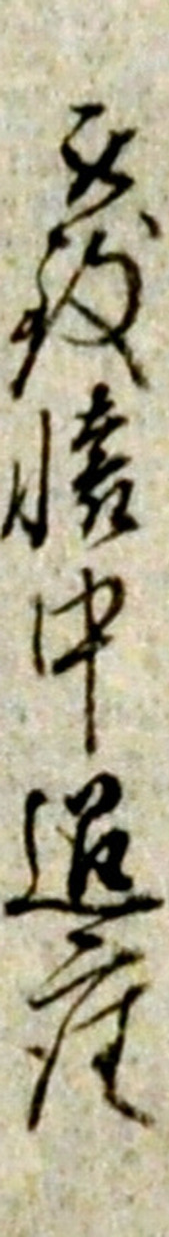披致懐中退座
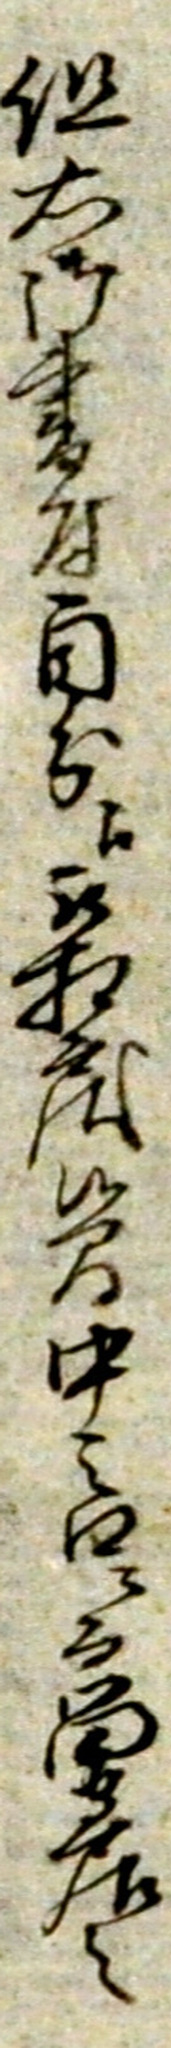但右御書付自分江被相戻候間中之間二而留守居之
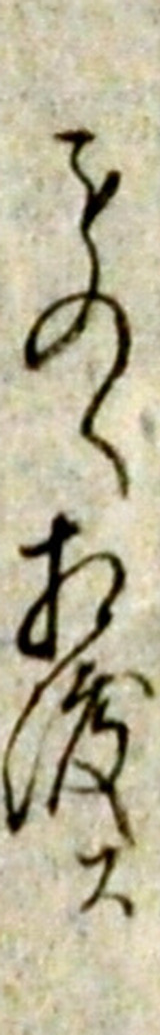ものへ相渡ㇲ
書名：日光御名代相勤候節ノ留
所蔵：伊那市立高遠町図書館・合同会社AMANE
